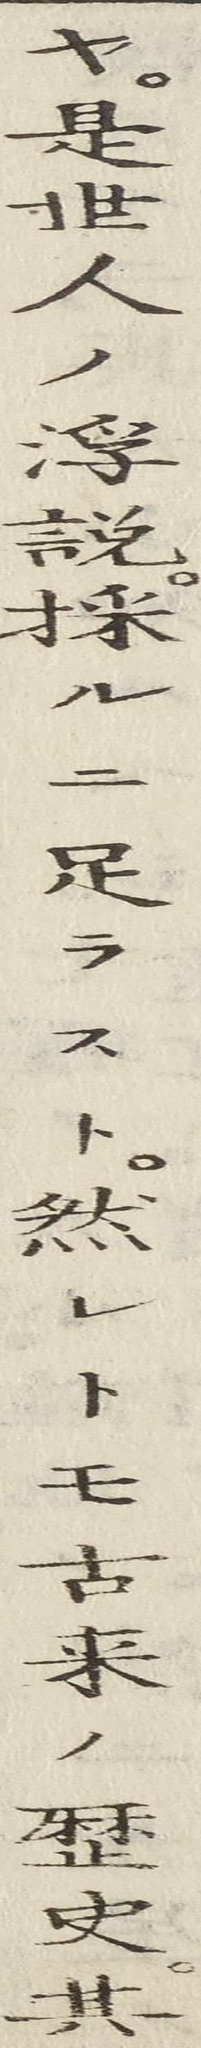ヤ。是世人ノ浮説。採ルニ足ラスト。然レトモ古来ノ歴史。其
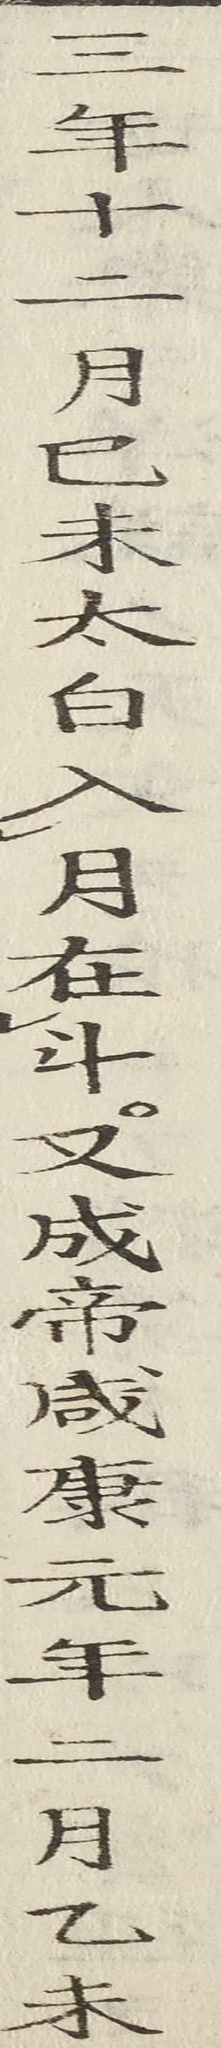三年十二月已未太白入月在斗。又成帝咸康元年二月乙未
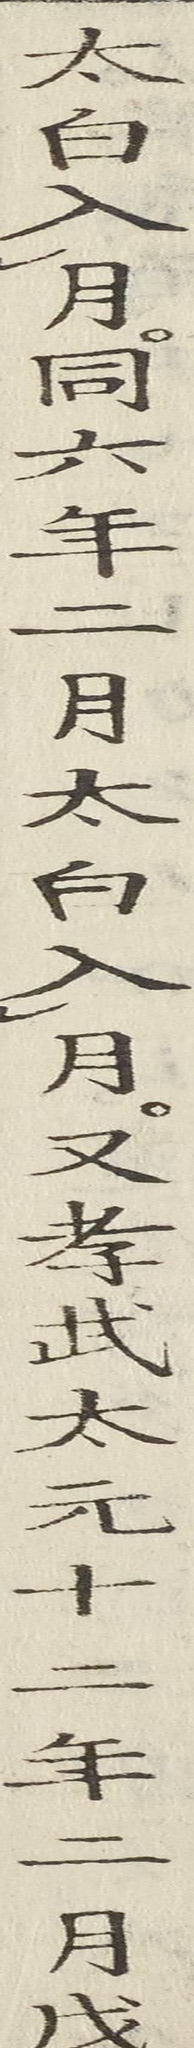太白入月。同六年二月太白入月。又孝武太元十二年二月戊
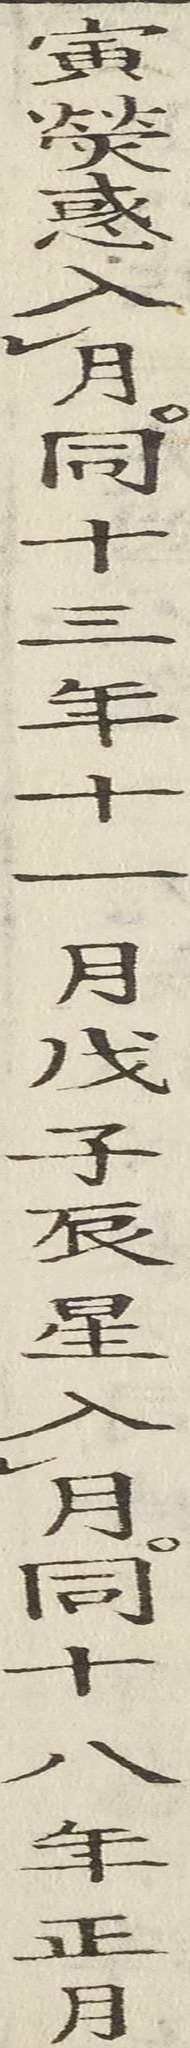寅熒惑入月。同十三年十一月戊子辰星入月。同十八年正月
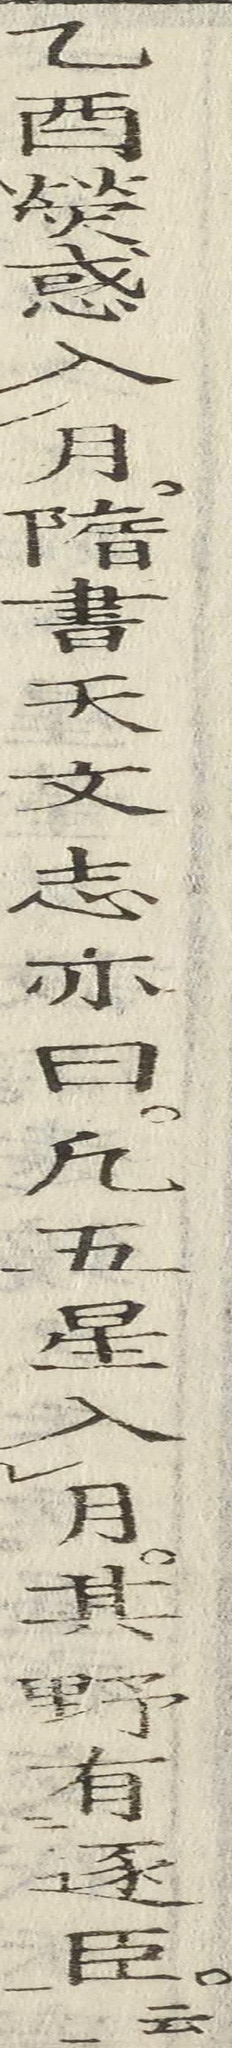乙酉熒惑入月。隋書天文志亦曰。凡五星入月。其野有ニ逐臣。云云
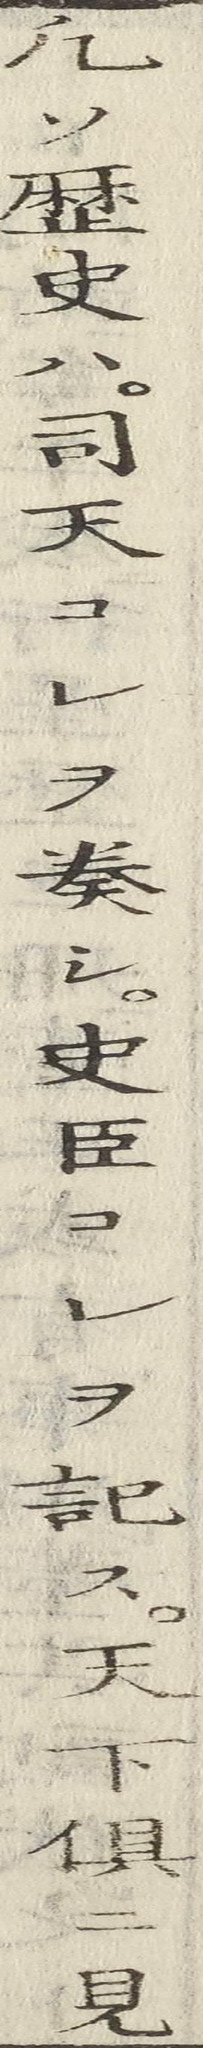凡ソ歴史ハ。司天コレヲ奏シ。史臣コレヲ記ス。天下倶ニ見
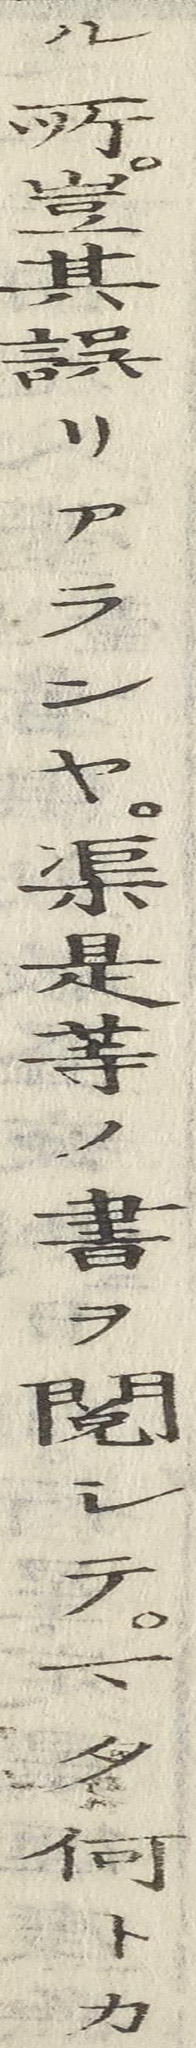ル所。豈其誤リアランヤ。渠是等ノ書ヲ閲シテ。マタ何トカ
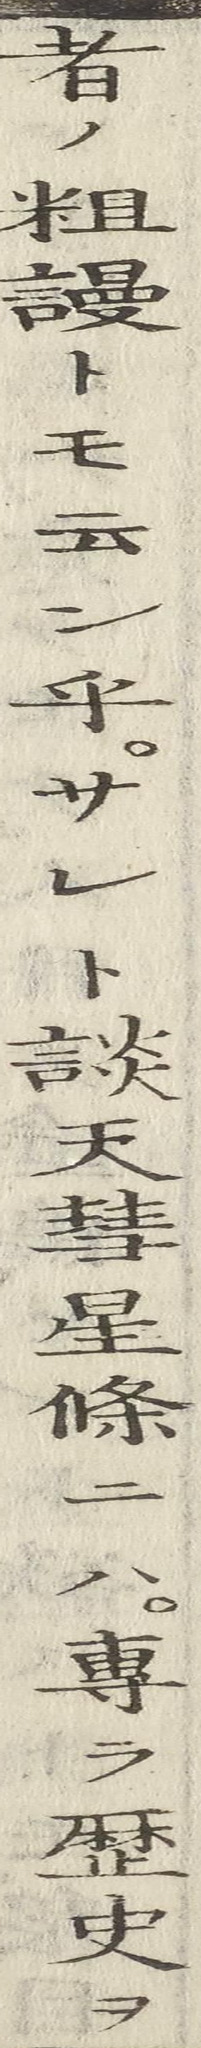者ノ粗謾トモ云ン乎。サレト談天彗星条ニハ。専ラ歴史ヲ
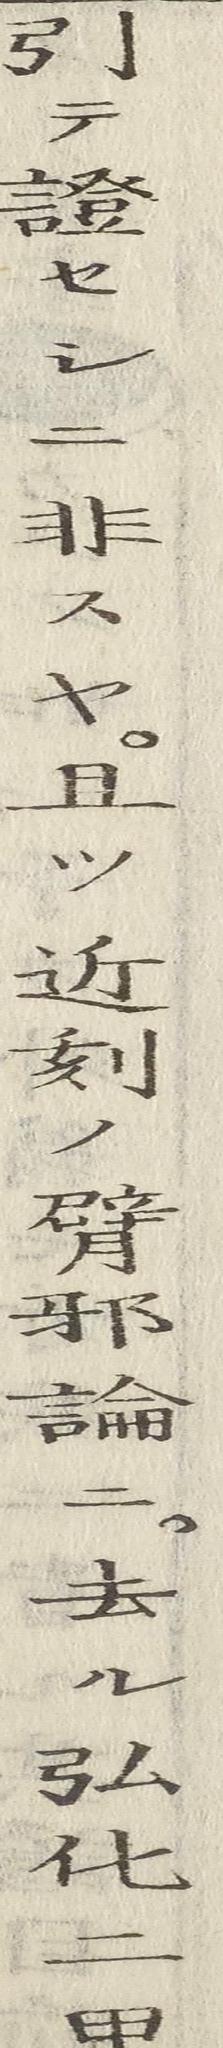引テ証セシニ非スヤ。且ツ近刻ノ臂邪論ニ。去ル弘化ニ甲
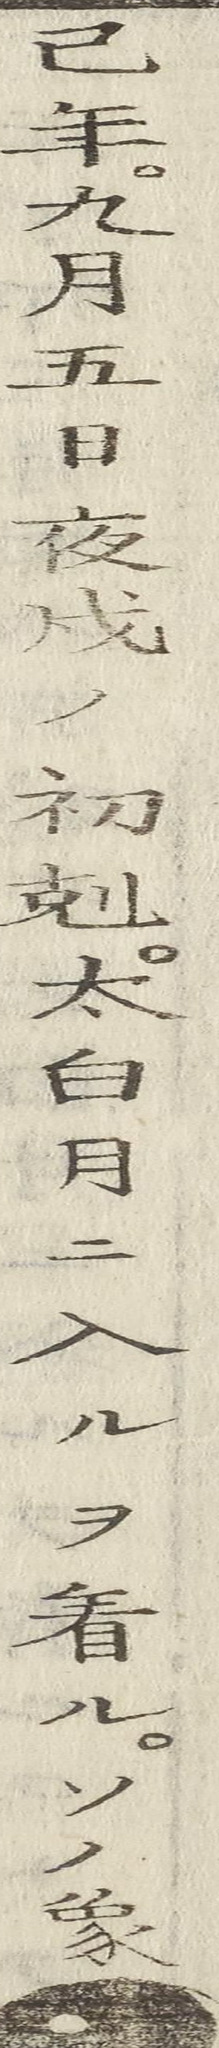巳年。九月五日夜戌ノ初剋。太白月ニ入ルヲ看ル。ソノ象
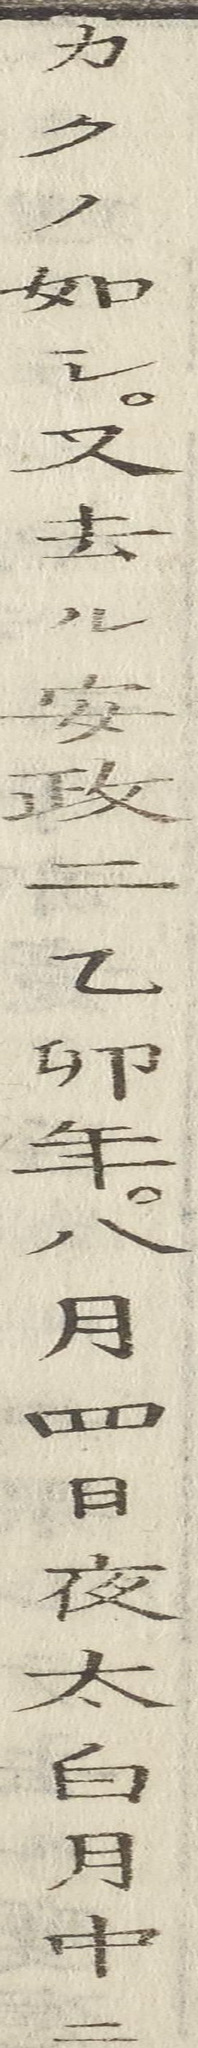カクノ如シ。又去ル安政ニ乙卯年。八月四日夜太白月中ニ
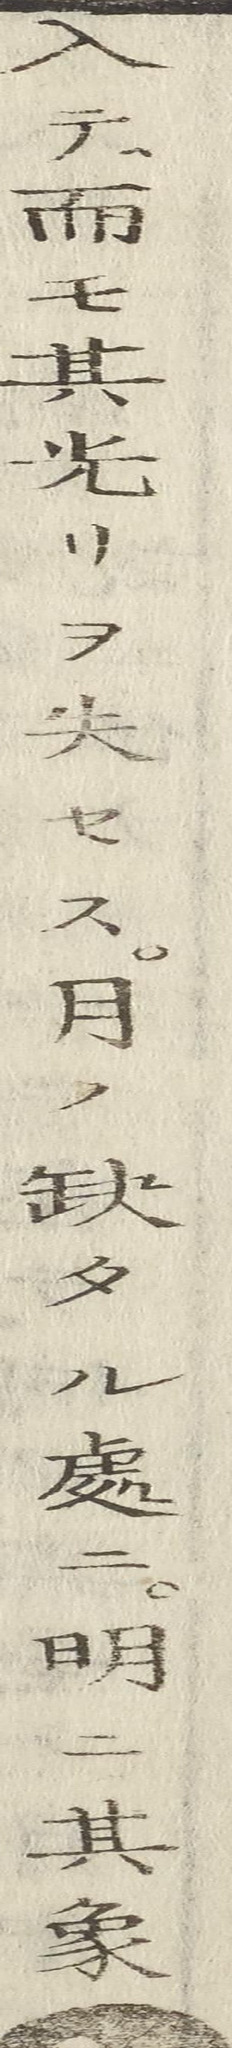入テ。而モ其光リヲ失セス。月ノ欫タル処ニ。明ニ其象
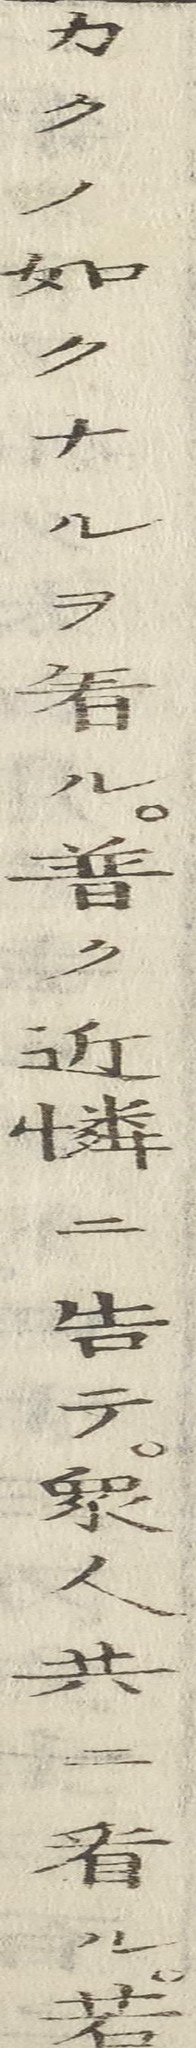カクノ如クナルヲ看ル。普ク近憐ニ告テ。衆人共ニ看ル。若

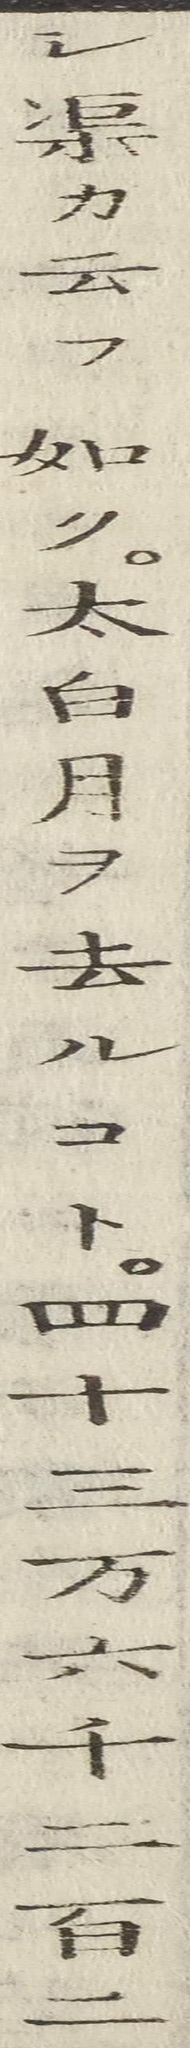シ渠カ云フ如ク。太白月ヲ去ルコト。四十三万六千二百二
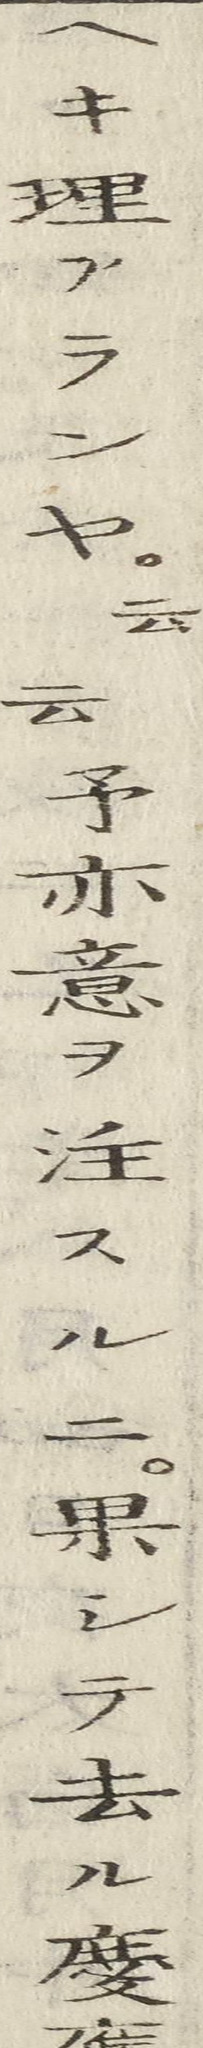ヘキ理アランヤ。云云予亦意ヲ注スルニ。果シテ去ル慶応
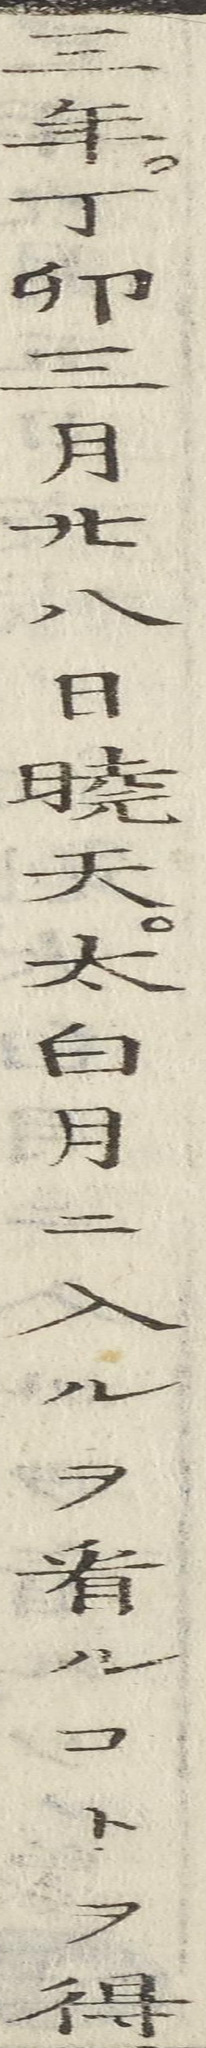三年。丁卯三月廿八日暁天。太白月ニ入ルヲ看ルコトヲ得
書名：護法新論　二編　下
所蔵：東京大学地震研究所図書室 Earthquake Research Institute Library, The University of Tokyo, JAPAN
